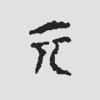亓（其）
